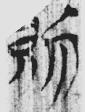則
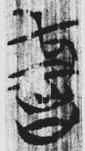○（辭）
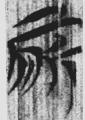所
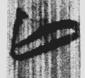㠯（以）
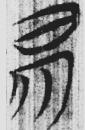昜
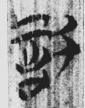信
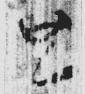也
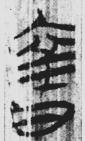害（蓋）
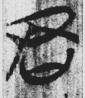君
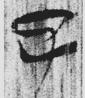子
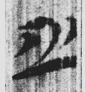之
